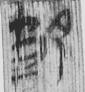○（范）
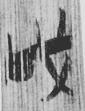戊
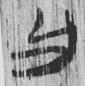曰
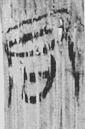君
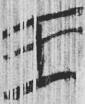王
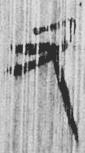又（有）
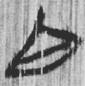白
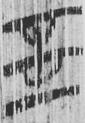玉
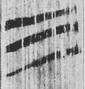三
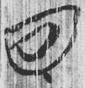回
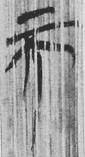而
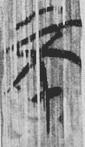不
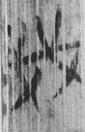戔
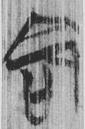命
